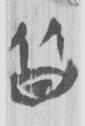皆
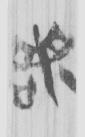若
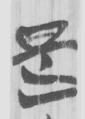是
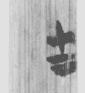十二
